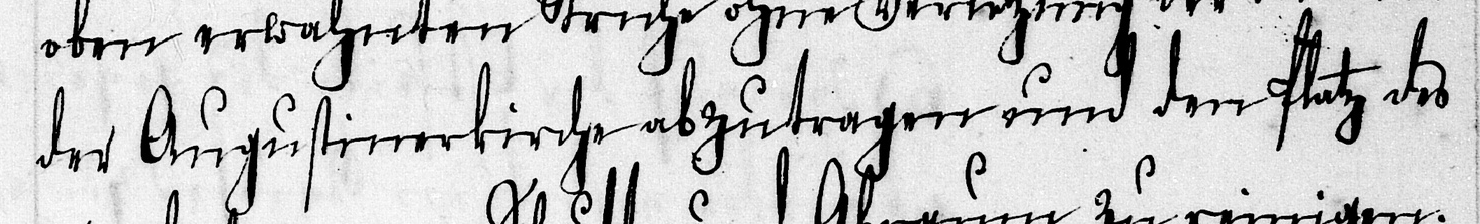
der Augustinerkirche abzutragen und den Platz des
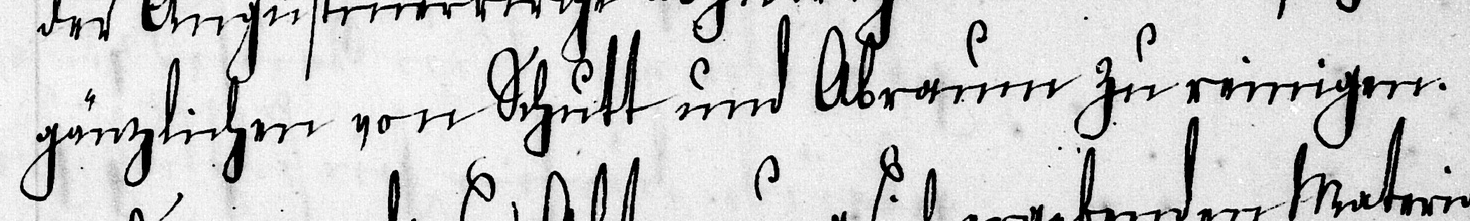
gänzlichen von Schutt und Abraum zu reinigen.
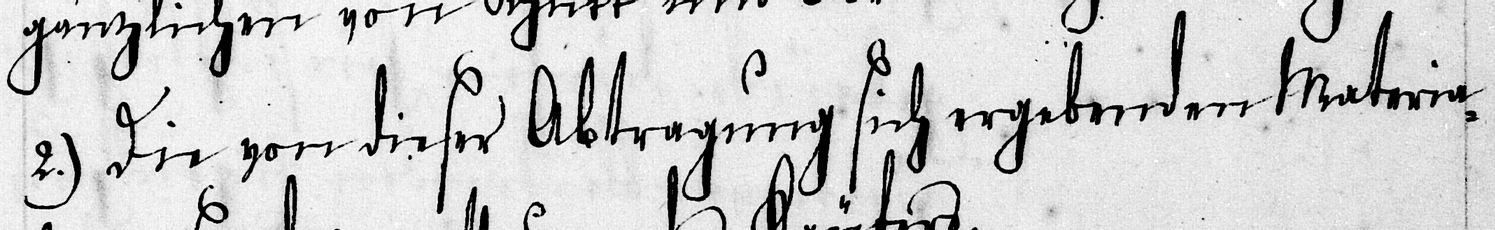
2.) Die von dieser Abtragung sich ergebenden Materia¬
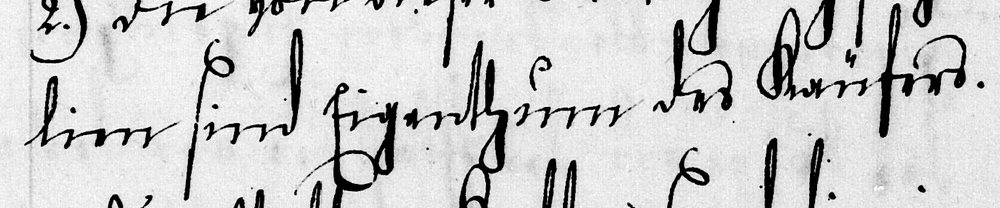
lien sind Eigenthum des Käufers.
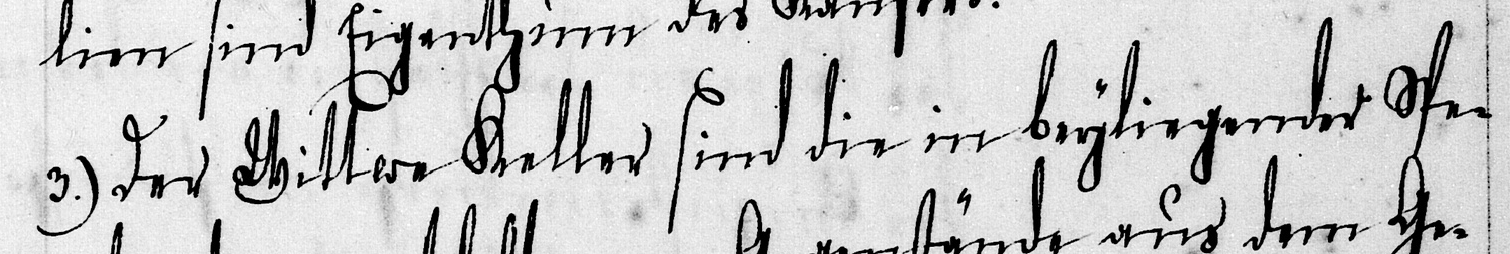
3.) Der Wittwe Keller sind die in beyliegender Spe¬
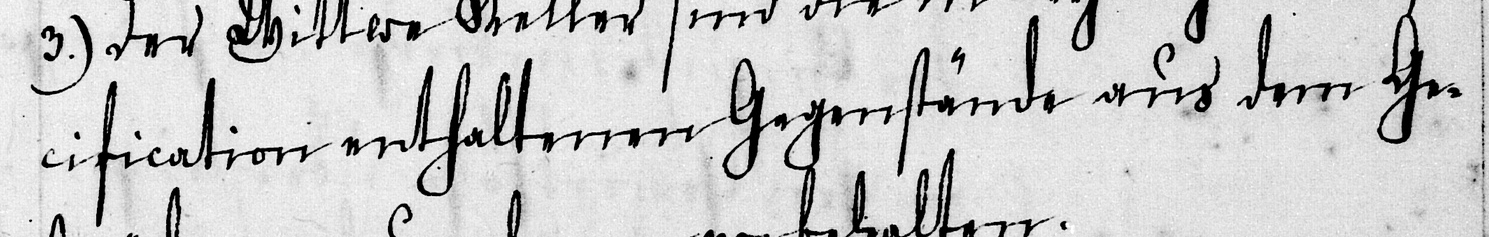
cification enthaltenen Gegenstände aus dem Ge¬
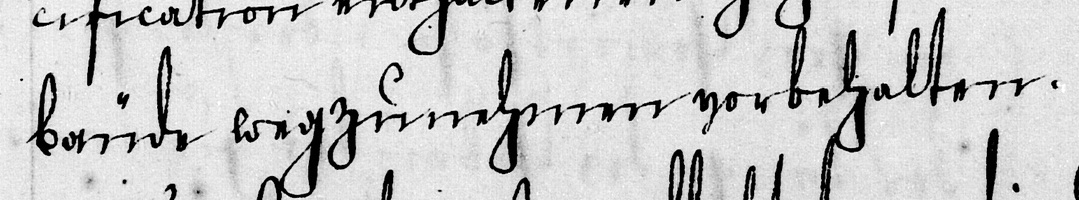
bäude wegzunehmen vorbehalten.
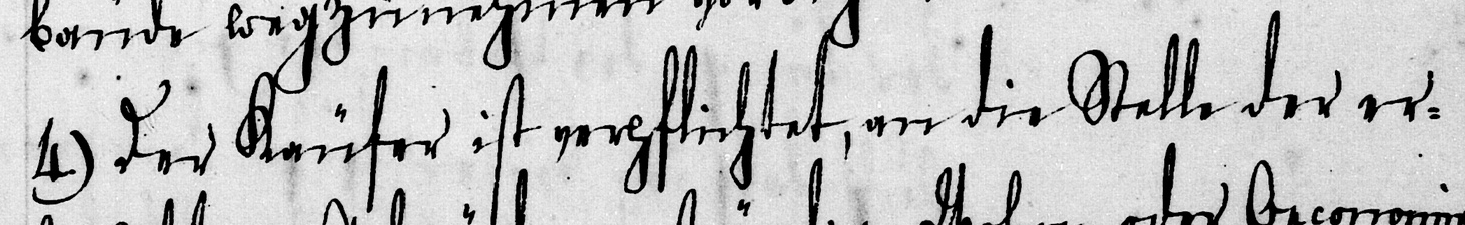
4.) Der Käufer ist verpflichtet, an die Stelle der er¬
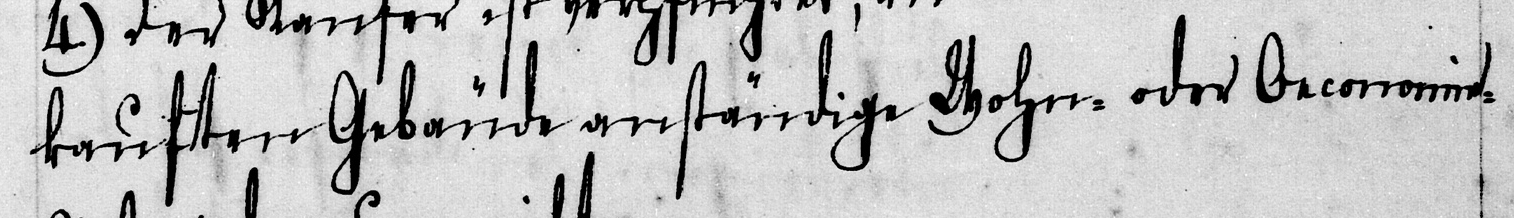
kauften Gebäude anständige Wohn- oder Oeconomi¬
